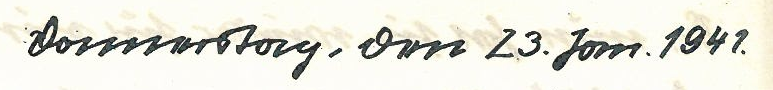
Donnerstag, den 23. Jan. 1941.
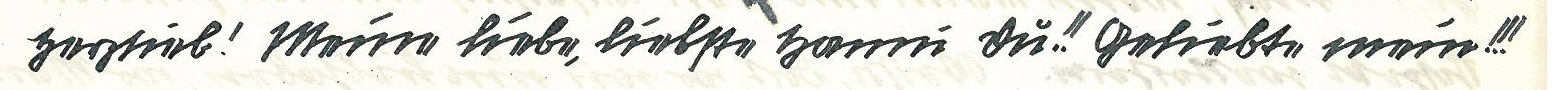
Herzlieb! Meine liebe, liebste Du!! Geliebte mein!!!
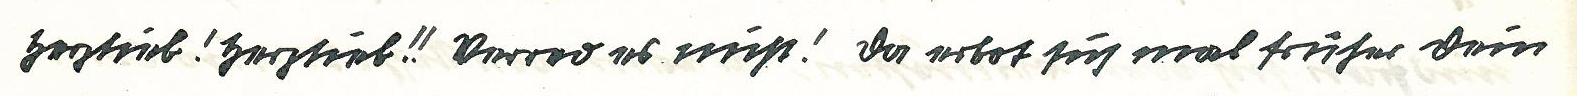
Herzlieb! Herzlieb!! Verred es nicht! Da erbot sich mal früher Dein
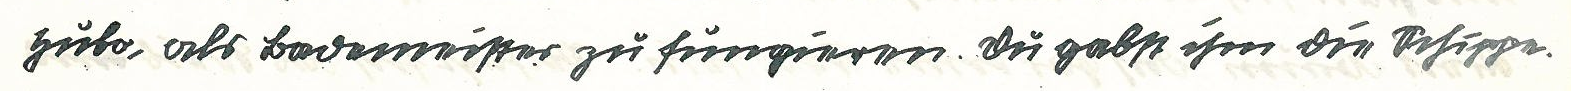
Hubo, als Bademeister zu fungieren. Du gabst ihm die Schippe.
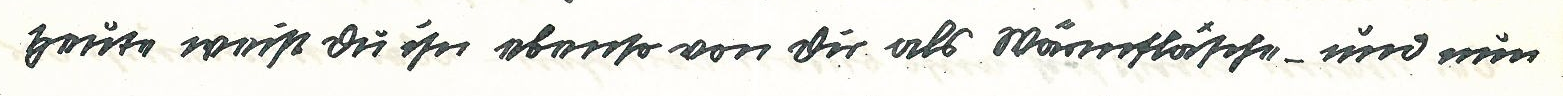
Heute weist Du ihn ebenso von Dir als Wärmflasche – und nun
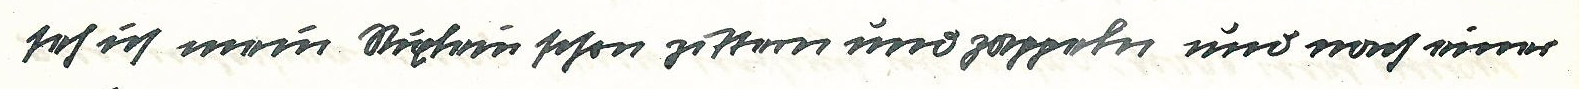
seh ich mein Vöglein schon zittern und zappeln und nach einer
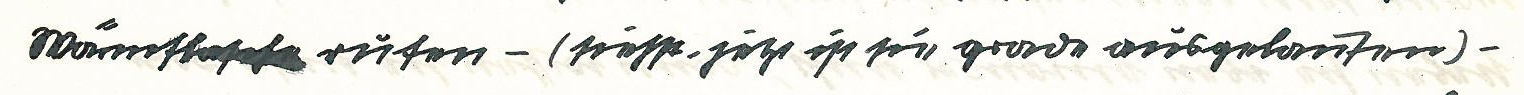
Wärmflasche rufen – (siehst, jetzt ist sie grade ausgelaufen) –
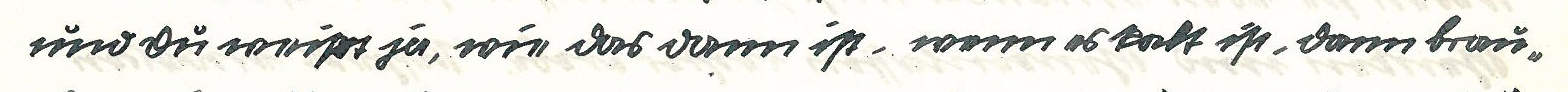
und Du weißt ja, wie das dann ist, wenn es kalt ist, dann brau¬
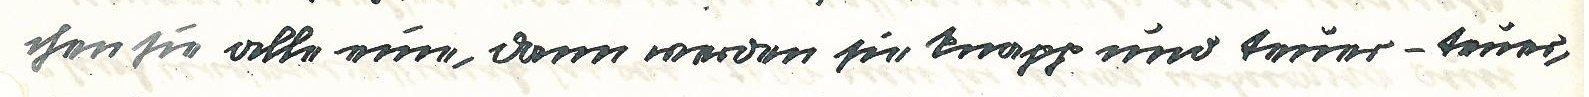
chen sie alle eine, dann werden sie knapp und teuer – teuer,
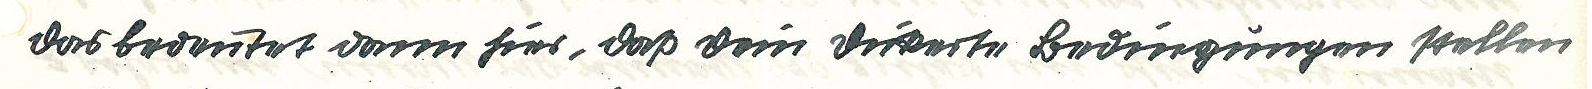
das bedeutet dann hier, daß Dein Dickerle Bedingungen stellen
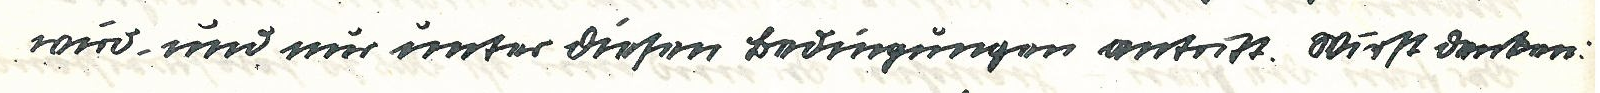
wird, und nur unter diesen Bedingungen antritt. Wirst denken:
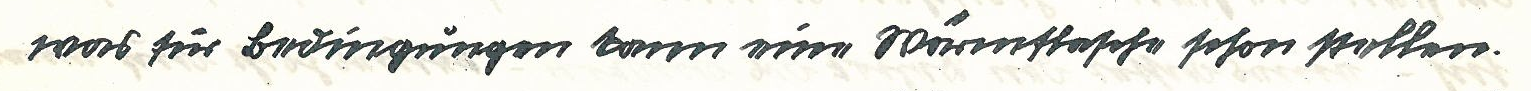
was für Bedingungen kann eine Wärmflasche schon stellen.
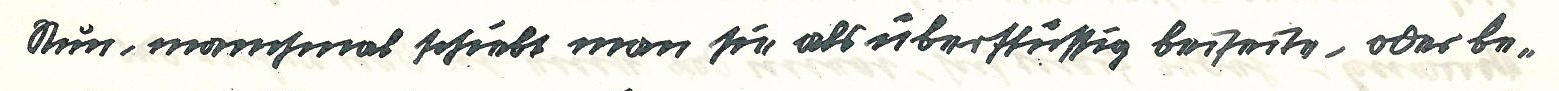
Nun, manchmal schiebt man sie als überflüssig beiseite, oder be¬
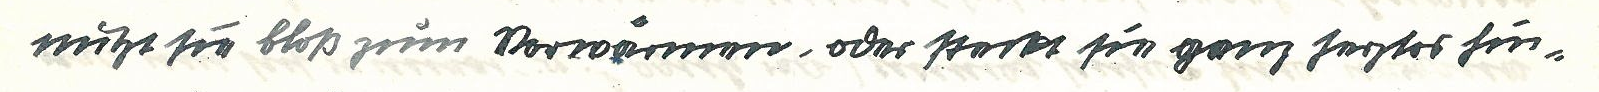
nutzt sie bloß zum Vorwärmen, oder steckt sie ganz herzlos hin¬
